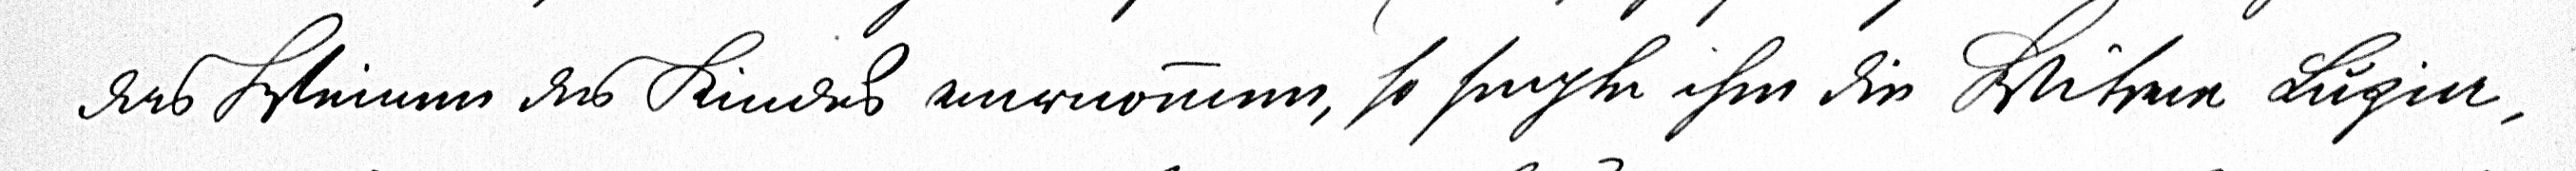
das xxeinen des Kindes vernommen, so sagte ihm die Witwe Luzia,
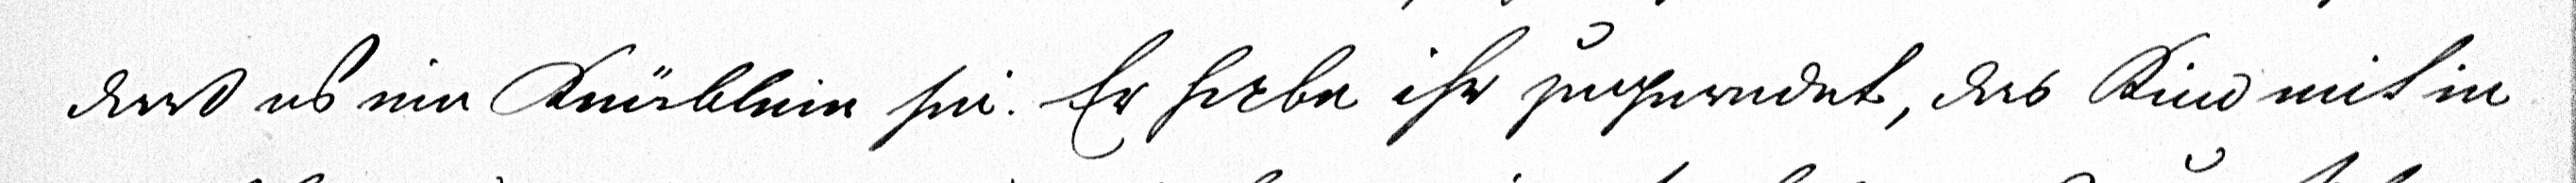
daß es ein Knäblein sei. Er habe ihr zugeredet, das Kind mit in
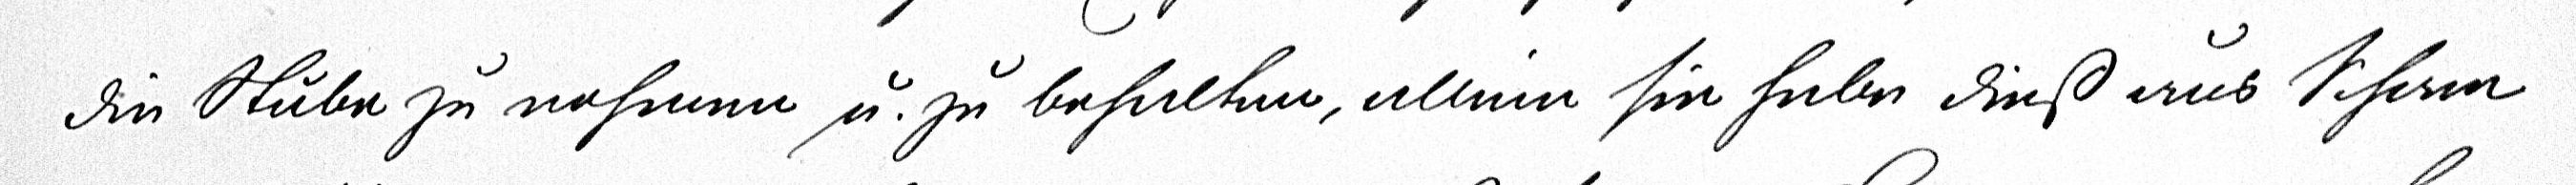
die Stube zu nahmen u. zu behalten, allein sie habe dieß aus Scham
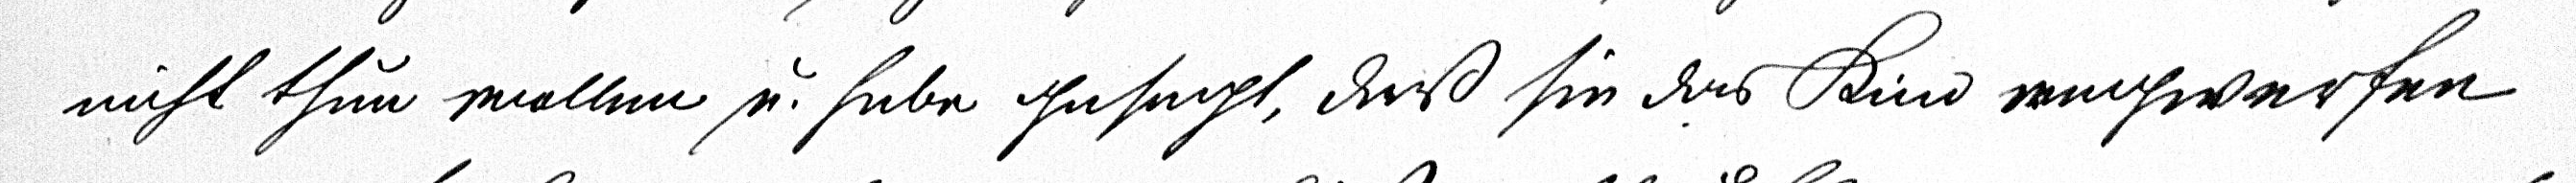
nicht thun wollen u. habe gesagt, daß sie das Kind wegwerfen
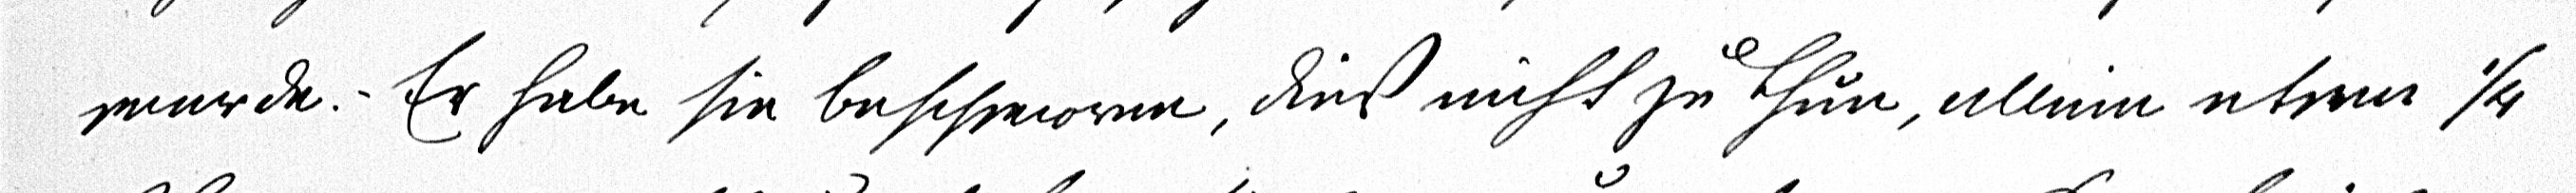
warde.- Er habe sie beschworen, dieß nicht zu thun, allein etwa ¼
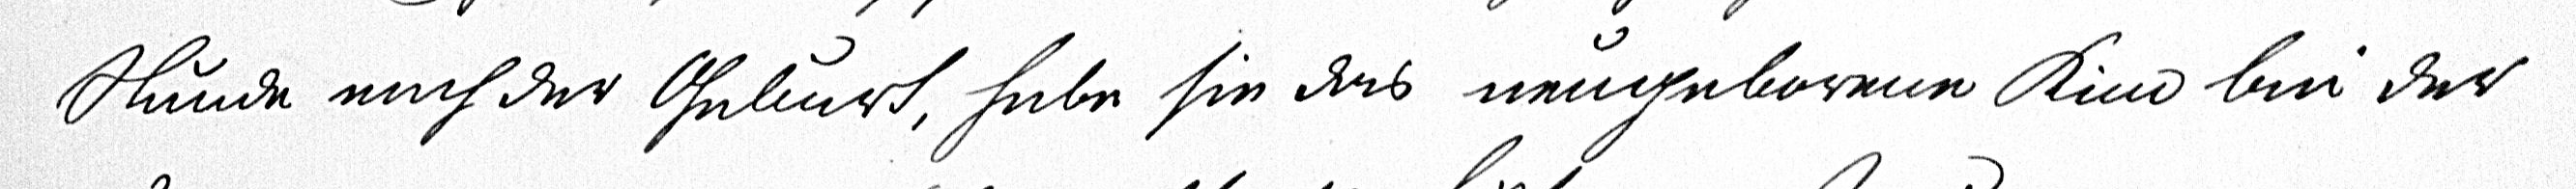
Stunde nach der Geburt, habe sie das neugeborene Kind bei der
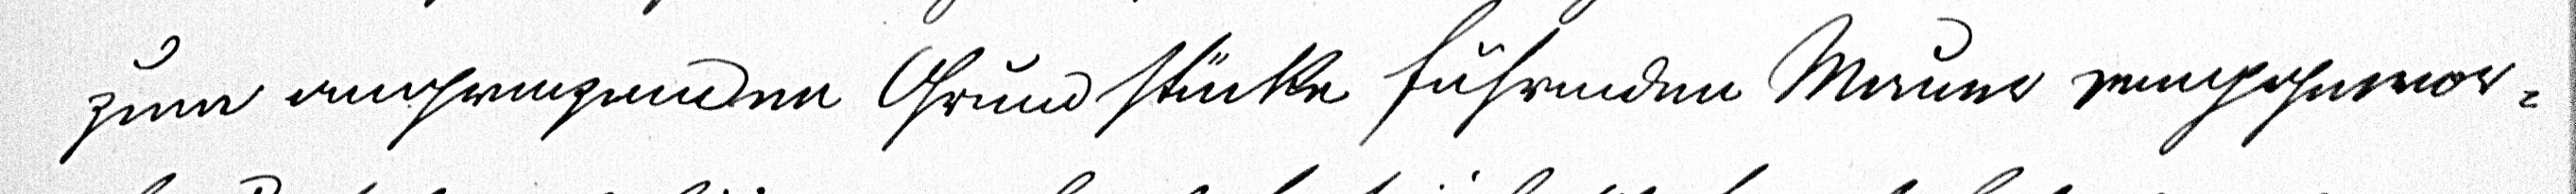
zum angrenzenden Grundstücke führenden Mauer weggewor¬
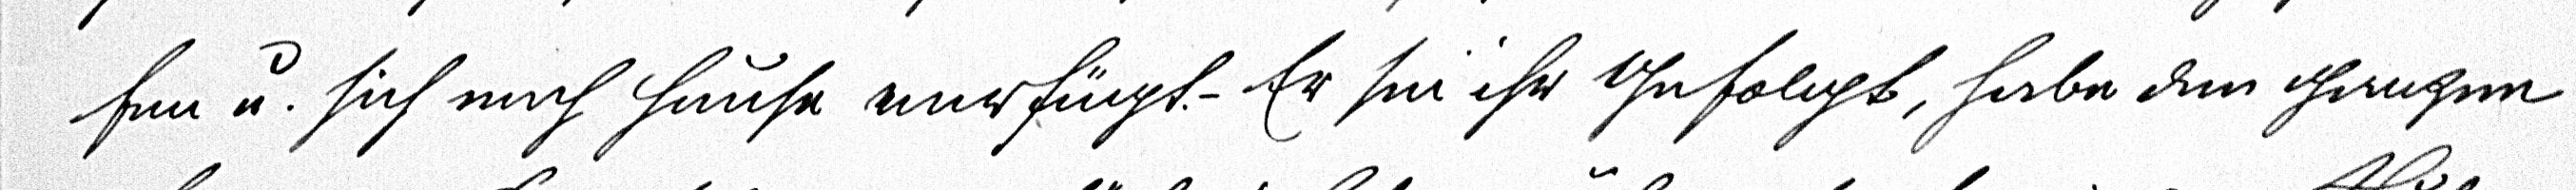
fen u. sich mich Hause verfügt.- Er sei ihr Gefolgt, habe den ganzen
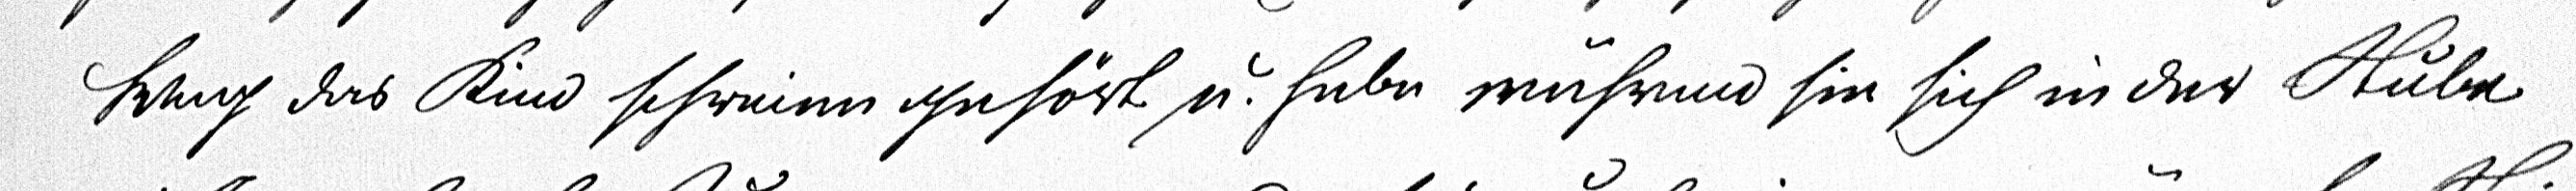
Weg das Kind schreien gehört u. habe während sie sich in der Stube
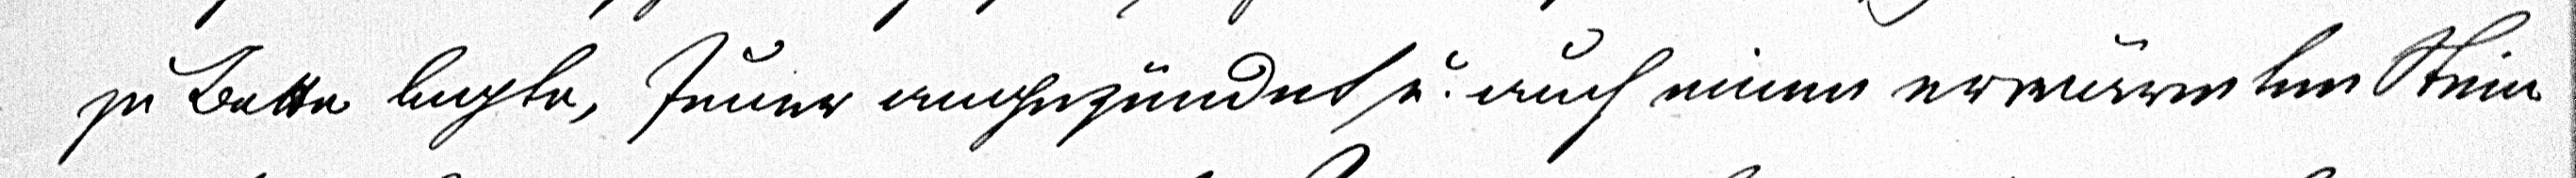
zu Bette legte, Feuer angezündet u. auch einen erwärmten Stein
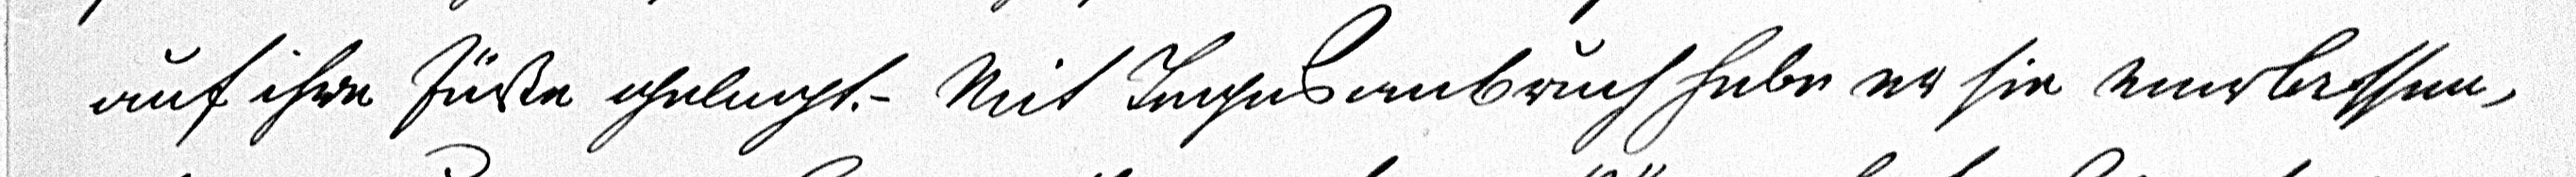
auf ihre Füße gelegt.- Mit Tagesanbruch habe er sie verlassen,
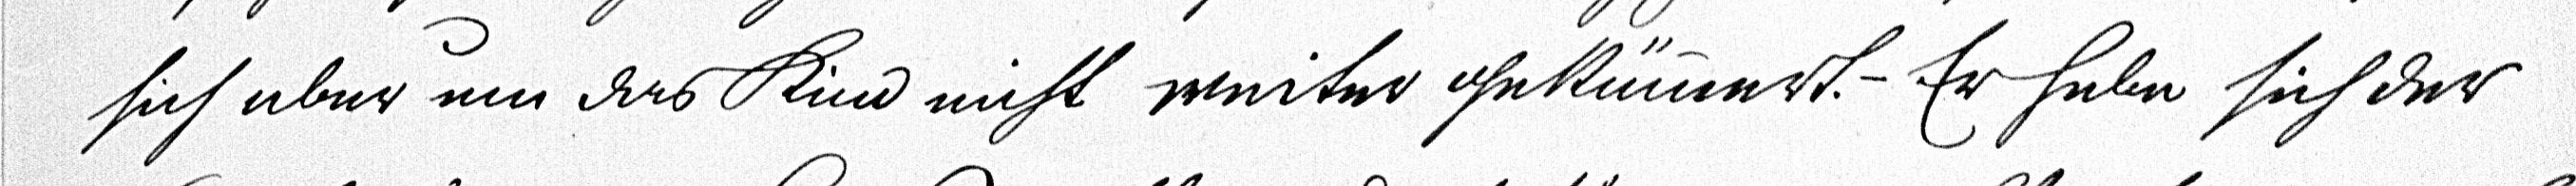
sich aber um das Kind nicht weiter gekümmert.- Er habe sich der
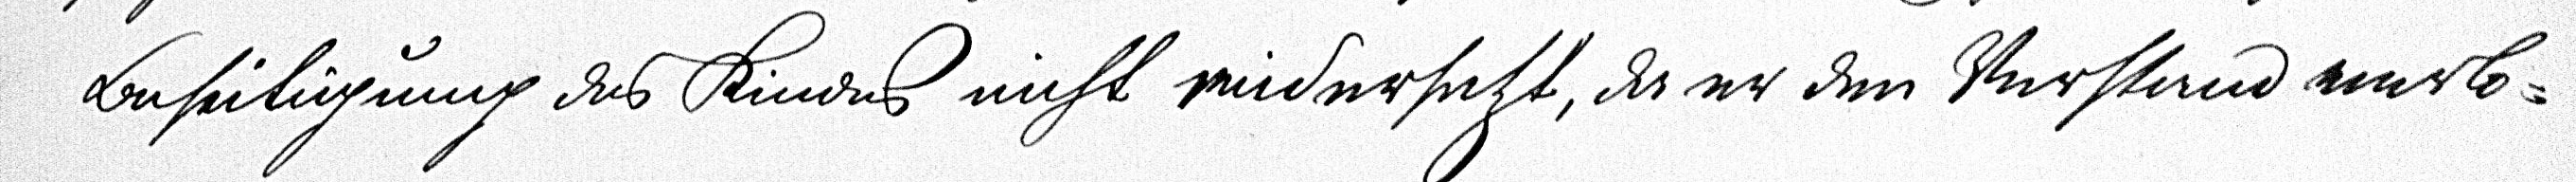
Beseitigung des Kindes nicht widersetzt, da er den Verstand xx-
